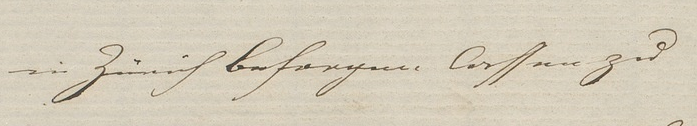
in Zürich besorgen lassen zu
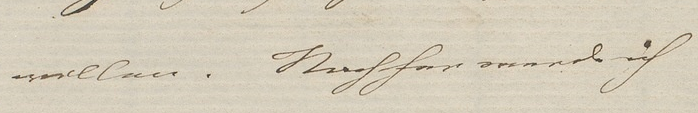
wollen. Nachher werde ich
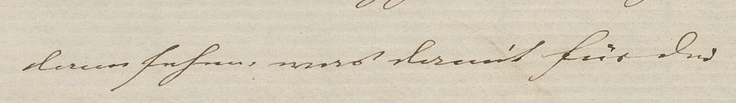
dann sehen, was damit für die
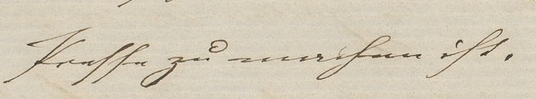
Presse zu machen ist.
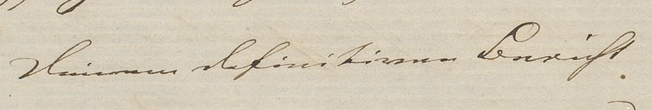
Deinem definitiven Bericht
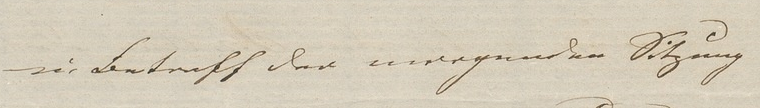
in Betreff der morgenden Sitzung
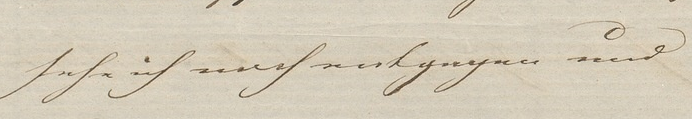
sehe ich noch entgegen und
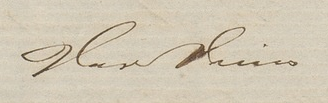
Der Deine
